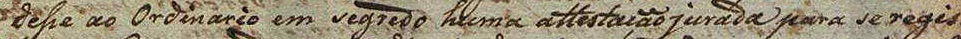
desse ao Ordinario em segredo huma attestação jurada para se regis
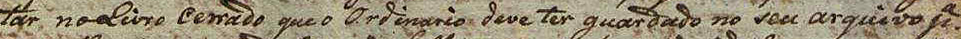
tar no Livro cerrado que o Ordinario deve ter guardado no seu arquivo pa.
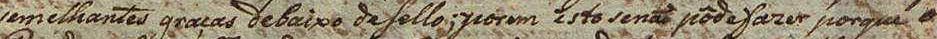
semelhantes graças debaixo de sello; porem isto senão pôde fazer porque o
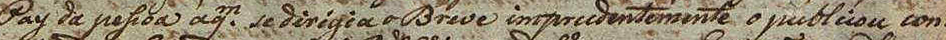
Pay da pessoa a qm. se dirigia a Breve imprudentemente o publicou con
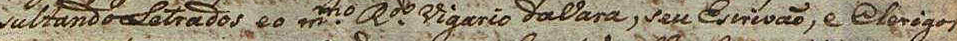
sultando Letrados e o mmo. Rdo. Vigario da Vara, seu Escrivão, e Clerigos
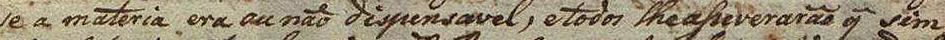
se a materia era ou não dispensavel, e todos lheasseverarão q̄ sim
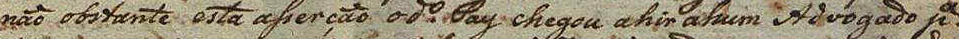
não obstante esta asserção o d.o Pay chegou a hir a hum Advogado pa.
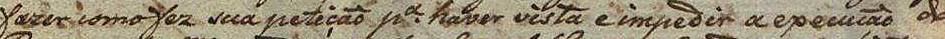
fazer como fez sua petição pa. haver vista e impedir a execução do
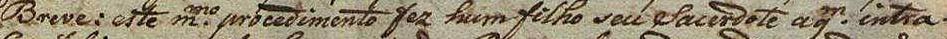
Breve: este mmo. procedimento fez hum filho seu Sacerdote a qm. intra
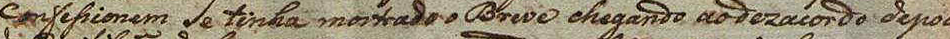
confessionem se tinha mostrado o Breve chegando ao dezacordo depois
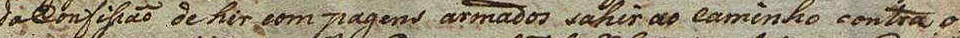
da Confissão de hir com pagens armados sahir ao caminho contra o
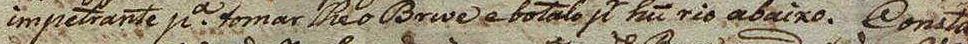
impetrante pa. tomar lhe o Breve e botalo pr hū rio abaixo. Consta
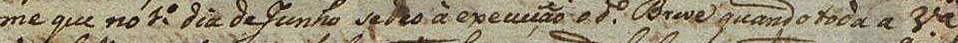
me que no 1.o dia de Junho se deo à execução o d.o Breve quando toda a V.a
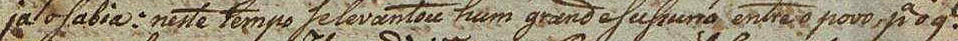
ja o sabia: neste tempo se levantou hum grande sussurro entre o povo, pa o ql.
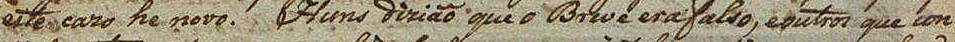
este cazo he novo. Huns dizião que o Breve era falso, e outros que con
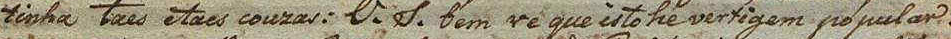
tinha taes e taes couzas: V. S. bem ve que isto he vertigem popular:
